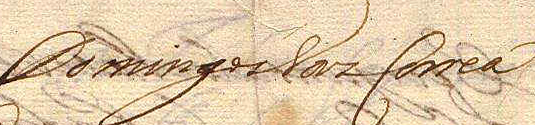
Domingos Vaz Correa
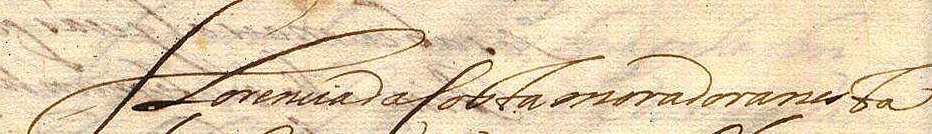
FLorencia da Costa moradora nesta
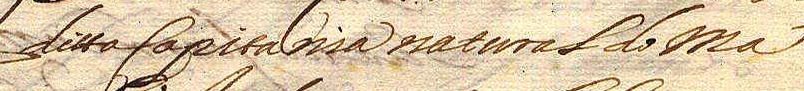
ditta Capitania, natural do Ma
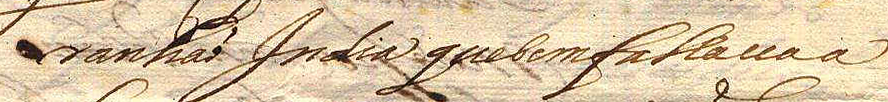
ranhaõ Jndia que bem fallaua a
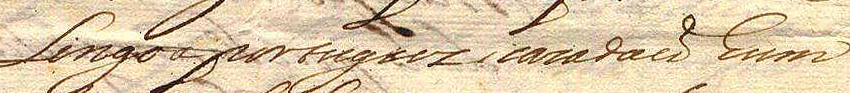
lingoa portuguez, cazada cō hum
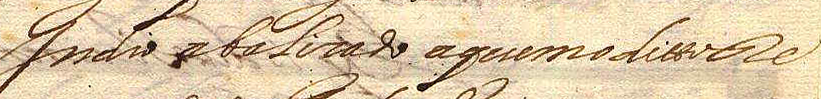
Jndio abalizado a quem o ditto Re
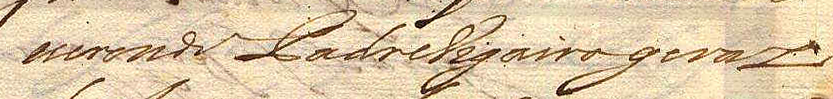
uerendo Padre Vigairo geraL
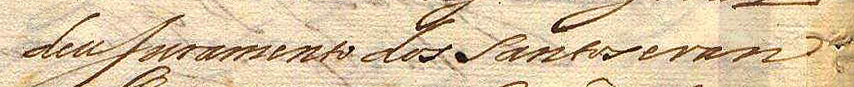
deu Juramento dos santos evan
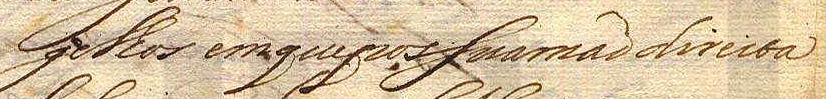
gelhos em que pos sua maõ direita
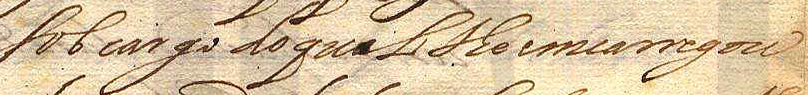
sob cargo do qual lhe emcarregou
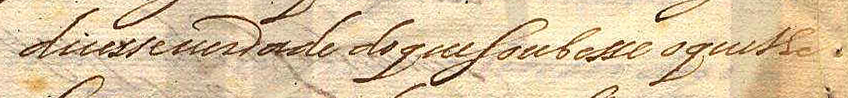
dicesse uerdade do que soubesse o que lhe
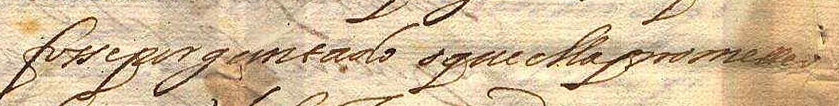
fosse perguntado o que ella prometteo
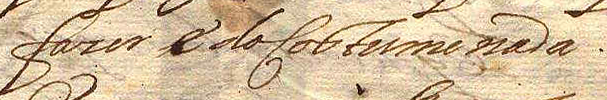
fazer E do Costume nada.
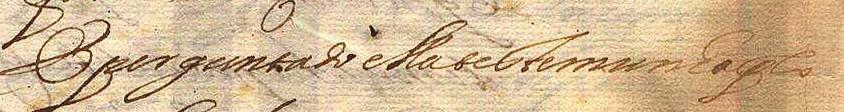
E perguntado ella testemunha p̄lo
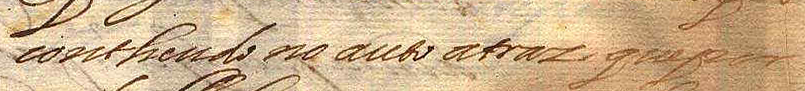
contheudo no auto atraz que por
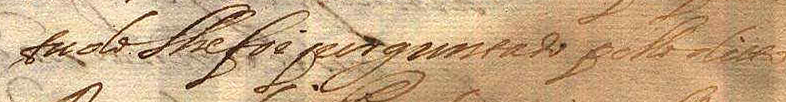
tudo lhe foi perguntado pello ditto
